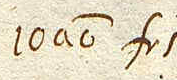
ioaõ frs̄
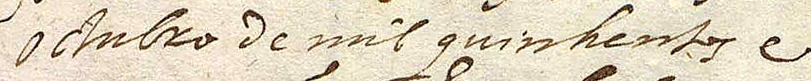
octubro de mil quinhentos e
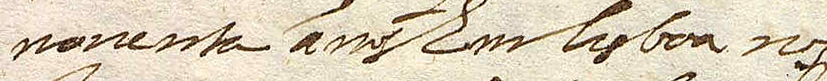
nouenta ānos Em lisboa nos
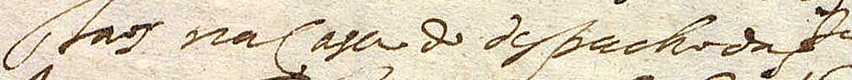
staos na Casa do despacho da sta
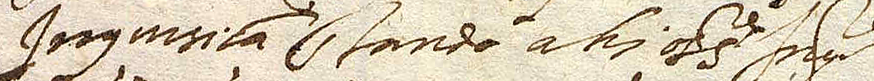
Jnquisiçā stando ahi os sres Jnq̄res
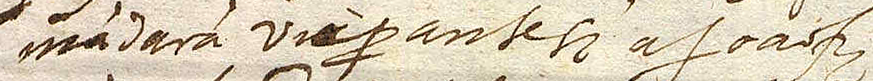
mādarā vir ꝓante si a Joao frz̄
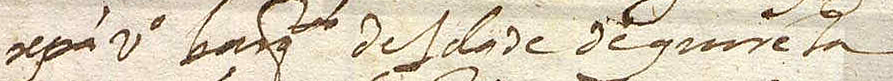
xpā vo barq̄ro de Jdade de quarēta
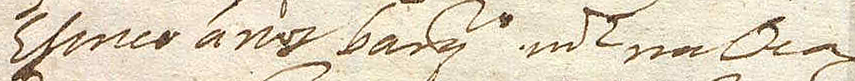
E sinco ānos barq̄ro mr naldea
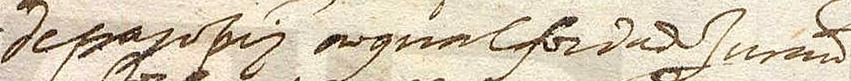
de pajo pīz ao qual foi dado Juramto
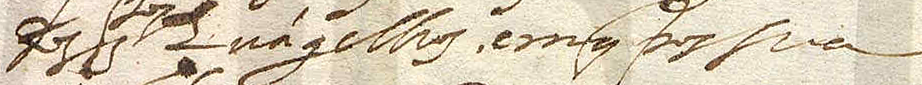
dos Stos Euāgelhos, em q̄ pos sua
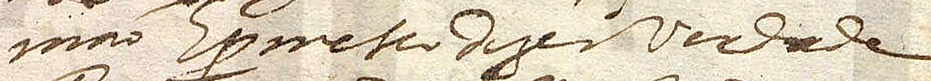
mão E ꝓmeteo dizer verdade
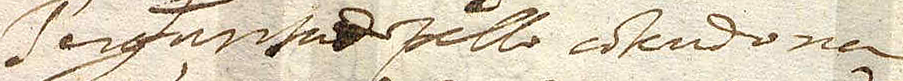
Perguntado pello cōteudo na
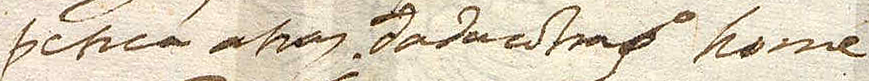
peticā atraz dada cōtra po homē
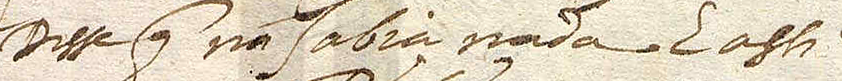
Disse q̄ nā sabia nada E assi
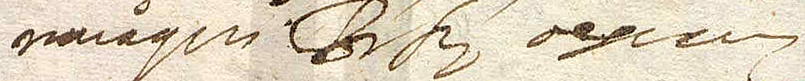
nou aqui Br̄ frz̄ o escreuj
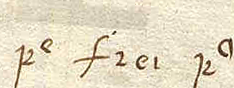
pe frei po
